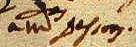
a mtas pessoas.
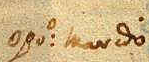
O poo: marido
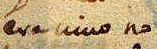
era uiuo no
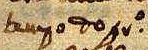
tempo do pro.
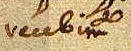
recebimto
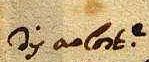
dis ao Cost.e
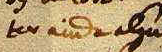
ter ainda algū
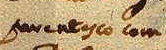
parentesco com
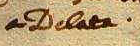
a Delata.
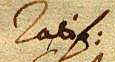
Ratif:
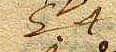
E 4
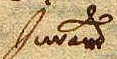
Juramto
